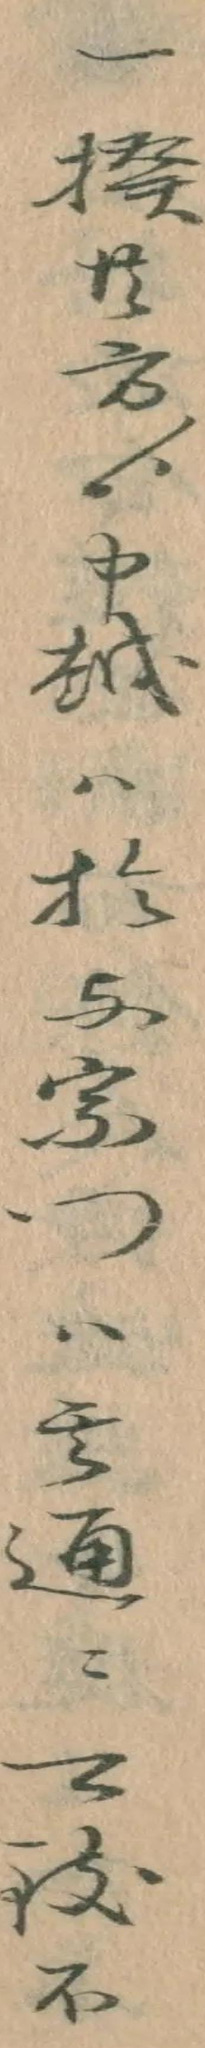一揆共方ゟ申越は於与宗門は其通に可致不
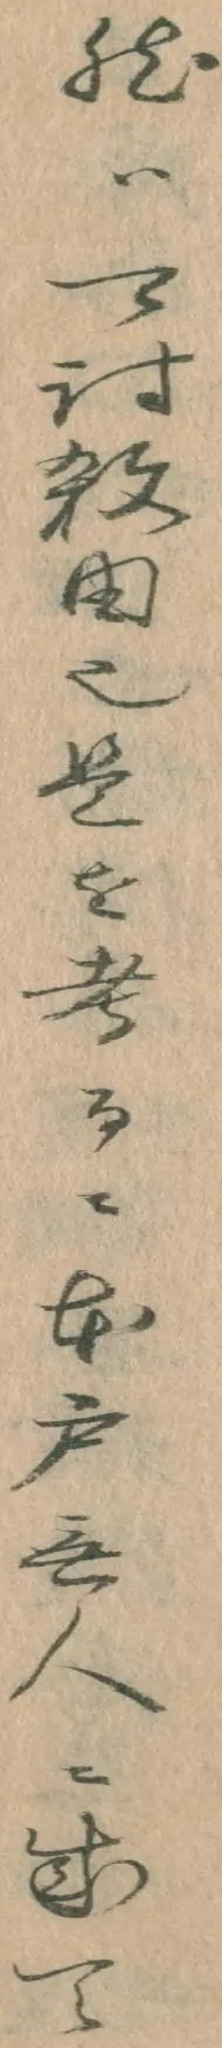然は可討殺由也是を考るに本戸無人に成て
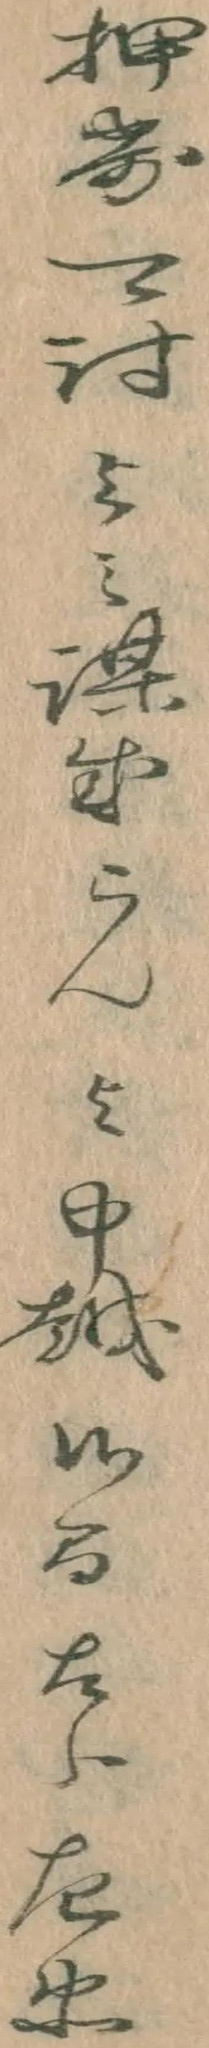押寄可討与之謀成らん与申越候間太郎左衛
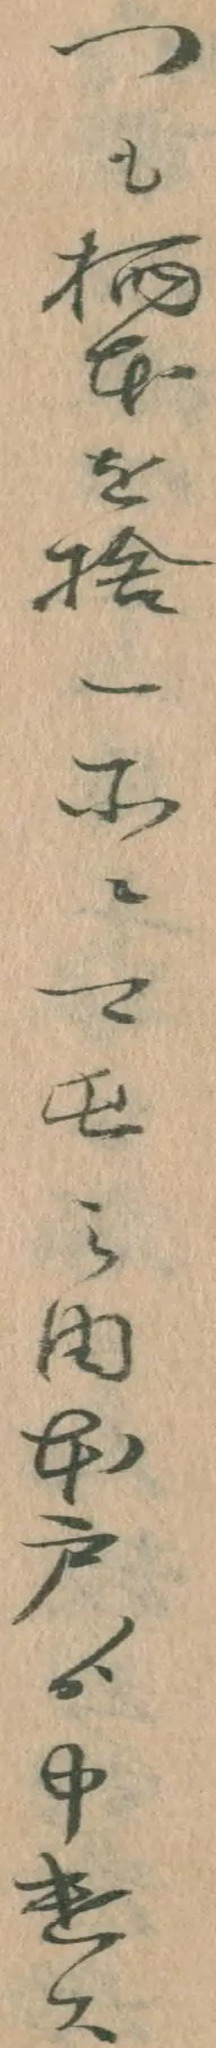門も栖本を捨一所に可屯之内本戸ゟ申遣す
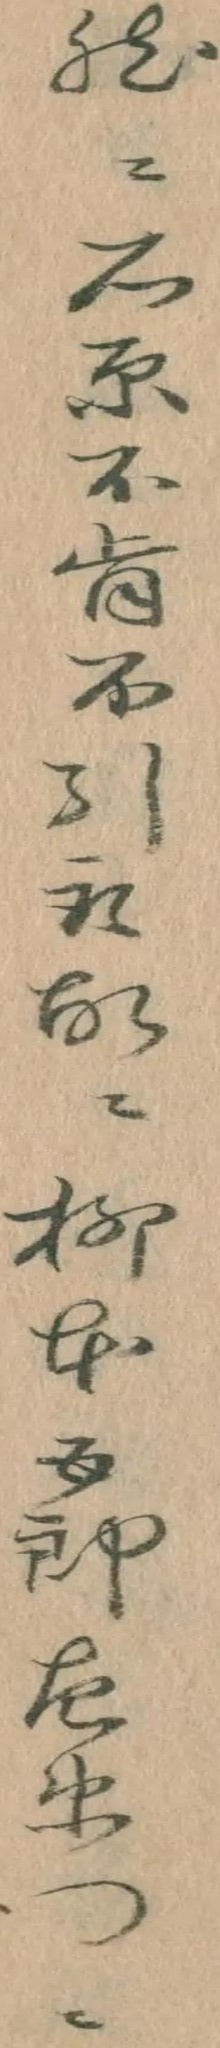然に石原不肯不引取故に柳本五郎右衛門に
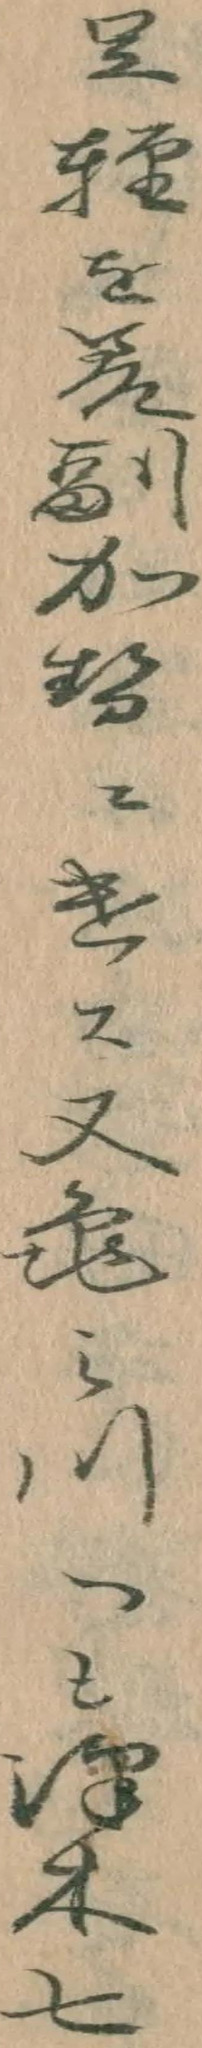足軽を差副加勢に遣す又亀之川へも沢木七
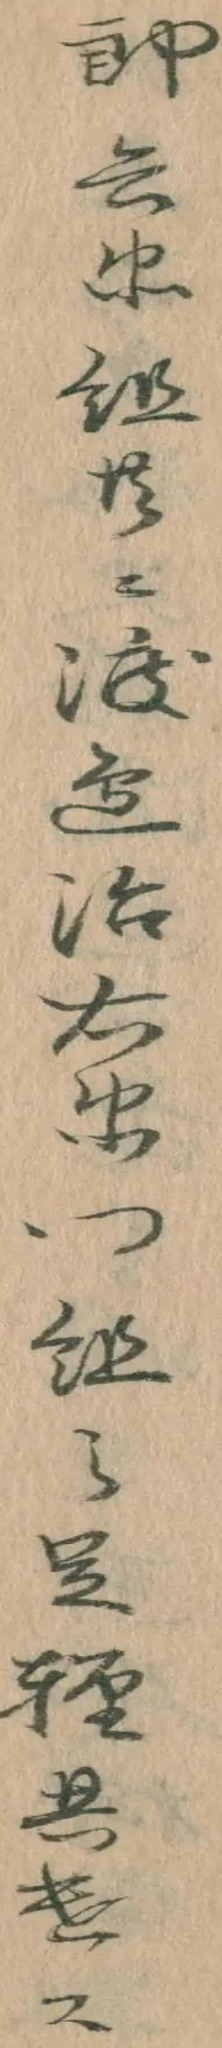郎兵衛組共に渡辺治右衛門組之足軽共遣す
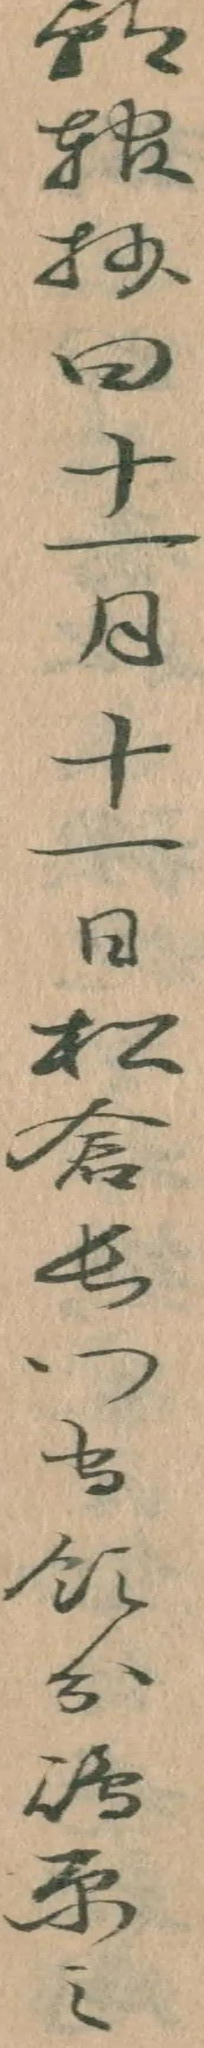朝報抄曰十一月十一日松倉長門守領分島原之
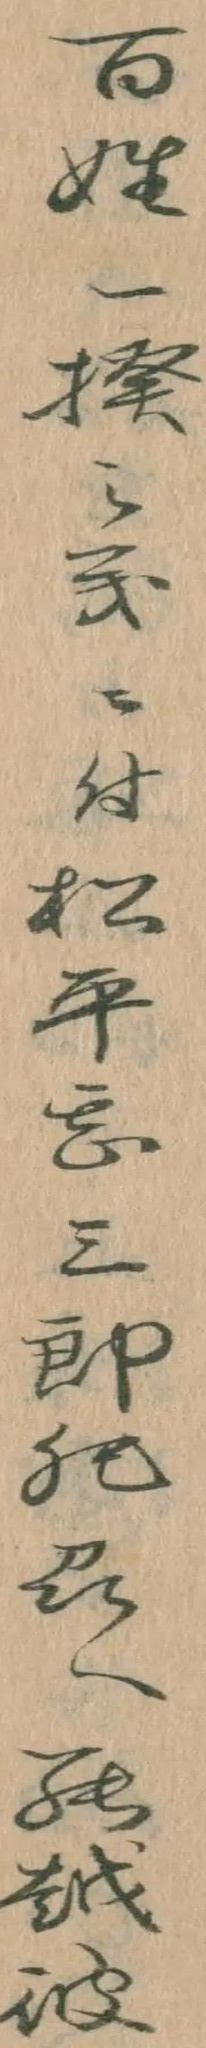百姓一揆之義に付松平甚三郎肥州へ罷越彼
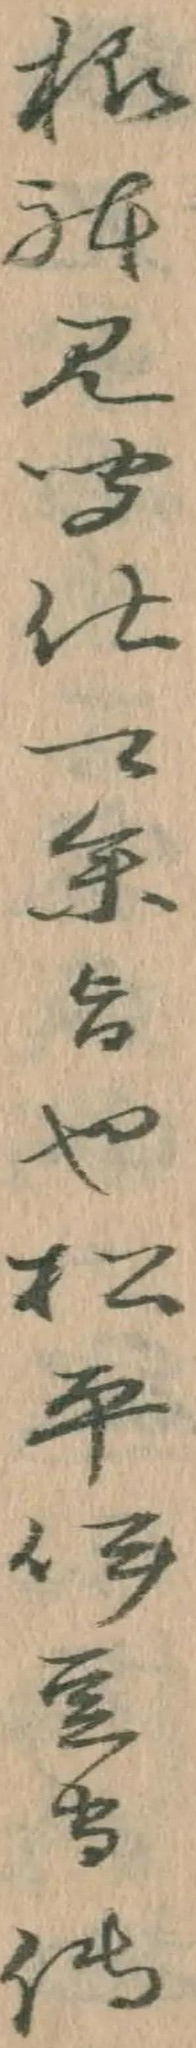様躰見聞仕可参旨や松平伊豆守伝
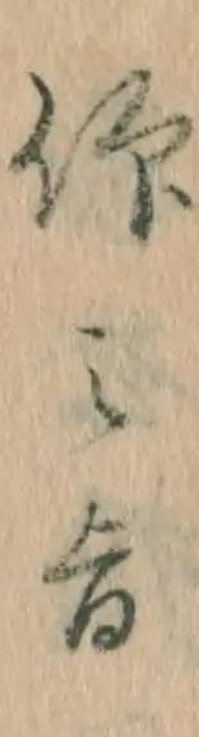仰之旨
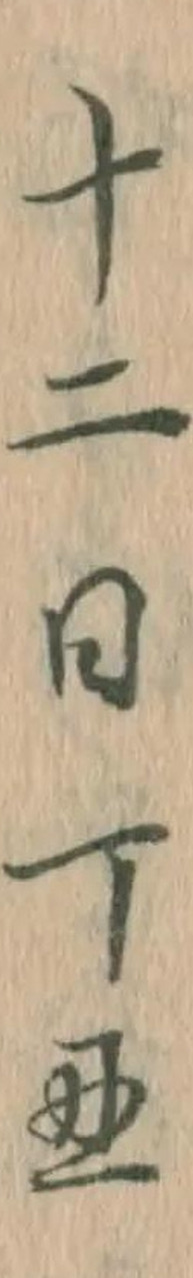十二日丁丑
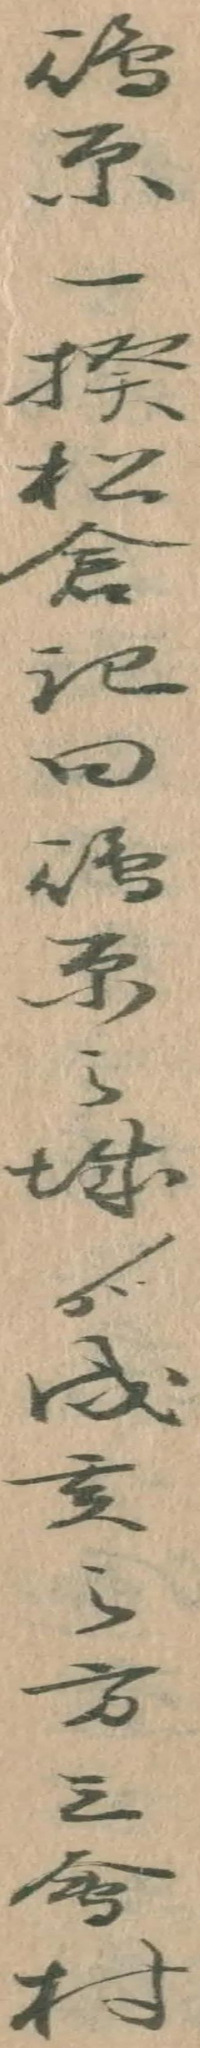島原一揆松倉記曰島原之城ゟ戌亥之方三会村
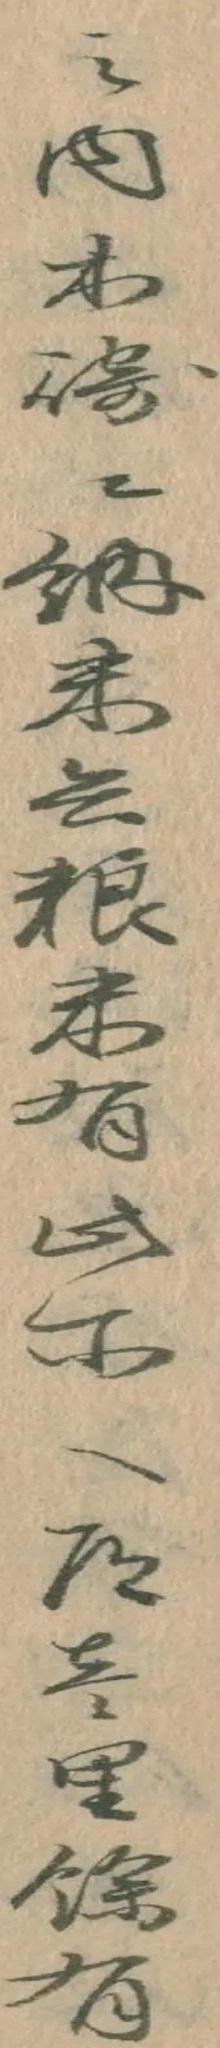之内木埼に納米兵粮未有此所へ道壱里余有
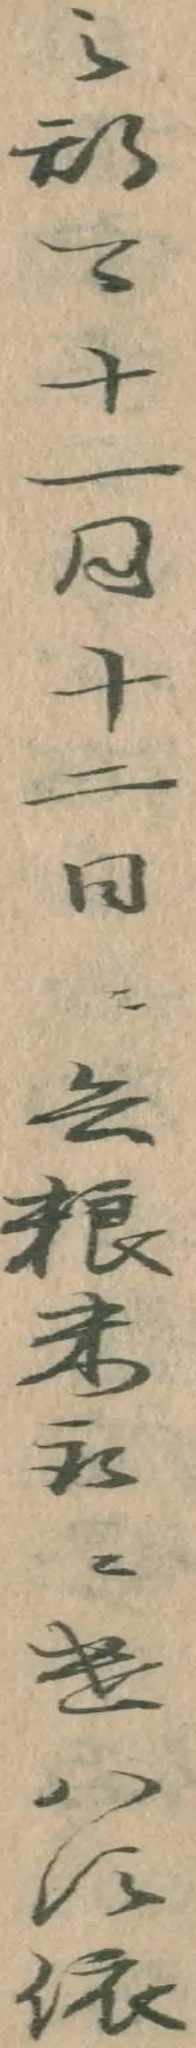之斯て十一月十二日に兵粮米取に遣は須依
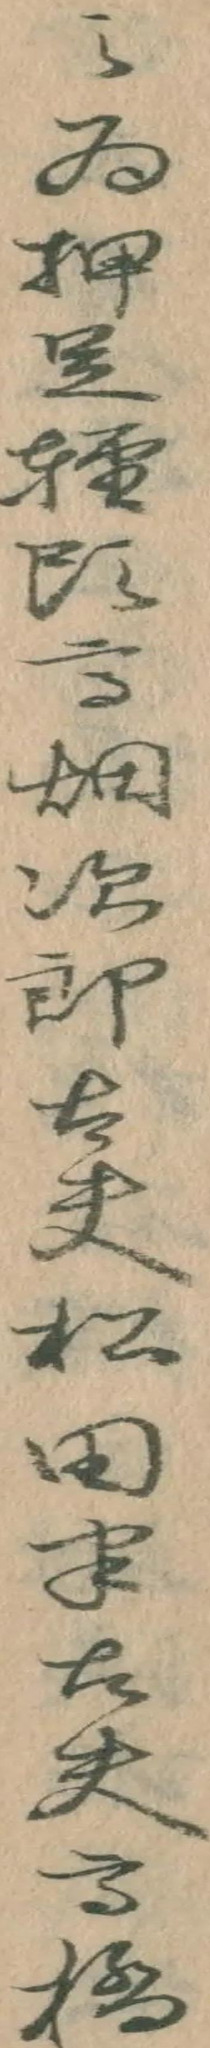之ゐ押足軽頭高畑次郎太夫松田半太夫高橋
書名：切支丹御退治記 49巻. [2]
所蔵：国立国会図書館 National Diet Library, JAPAN
